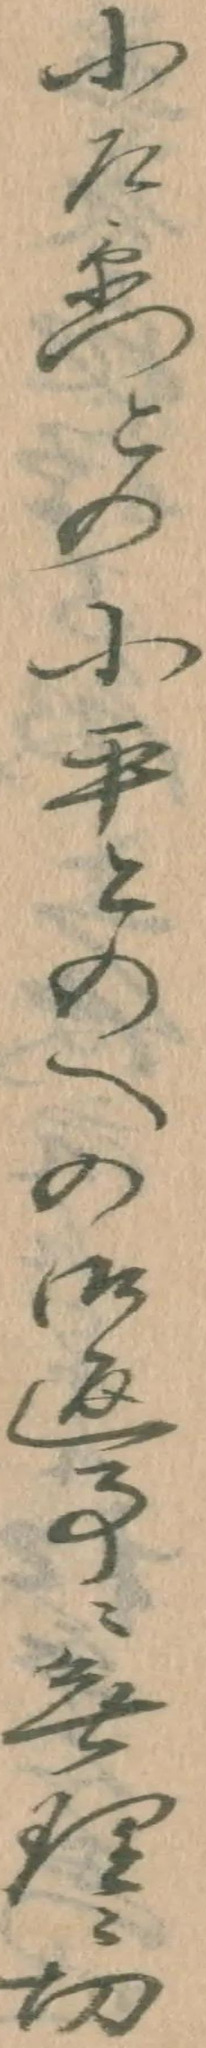小左衛門との小平とのへの御返事に無理に切
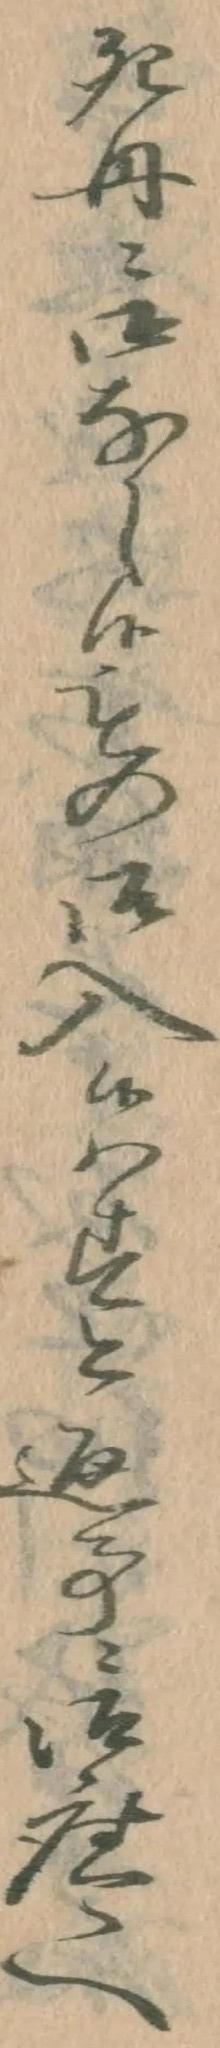死丹に御なし候もの御入候は春と返事に御座候へ
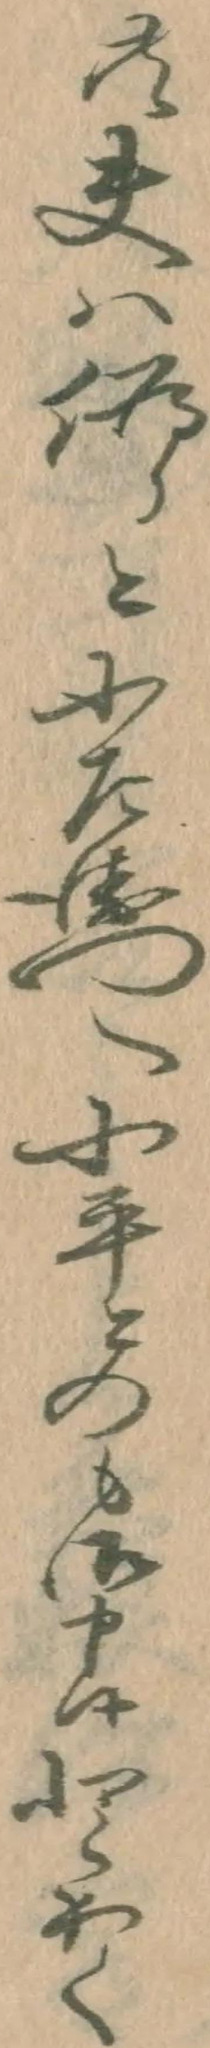共夫は併りと小左衛門へ小平とのも御申候登かく
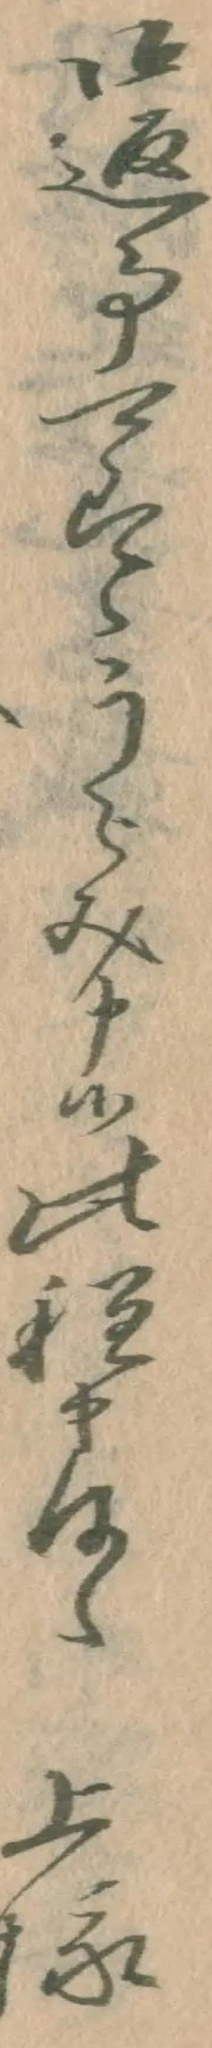御返事可尽候うらみ申候此程申参らせ候上様
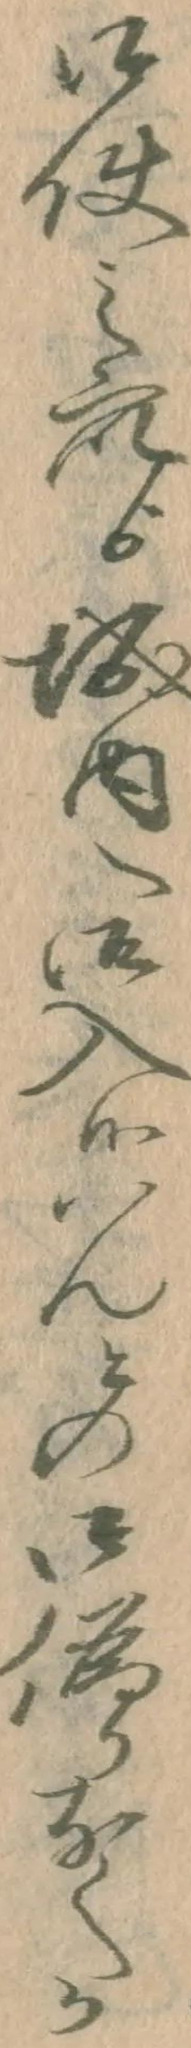御使之衆ゟ城内へ御入候はんとの御偽りなくか
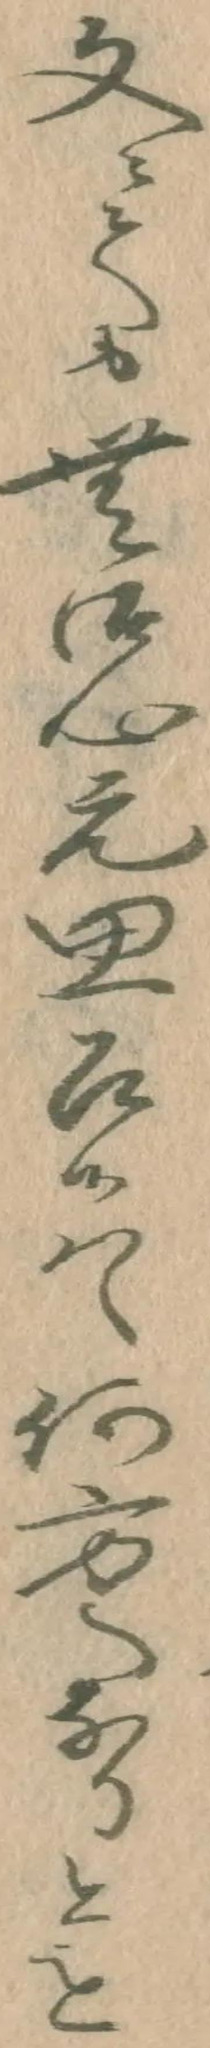文にても無御心元思召候はゝ何方へなりとを
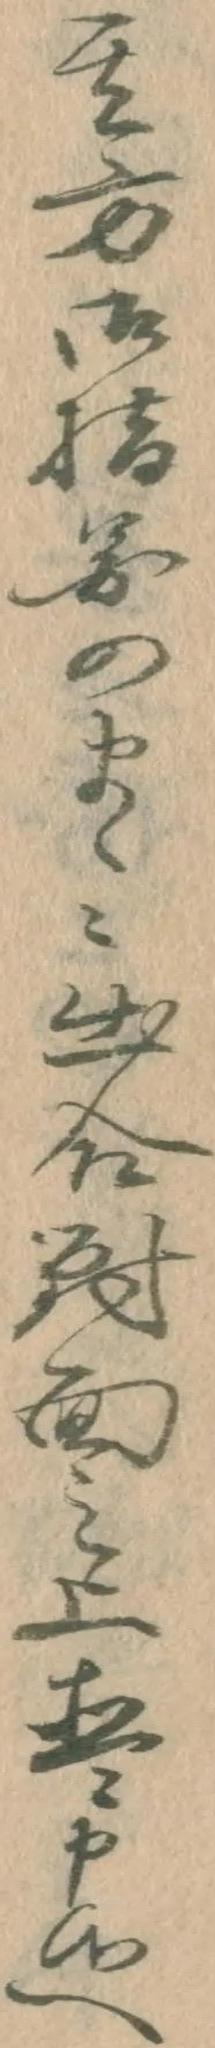其方御指図のまゝに出合対面之上直に申候へ
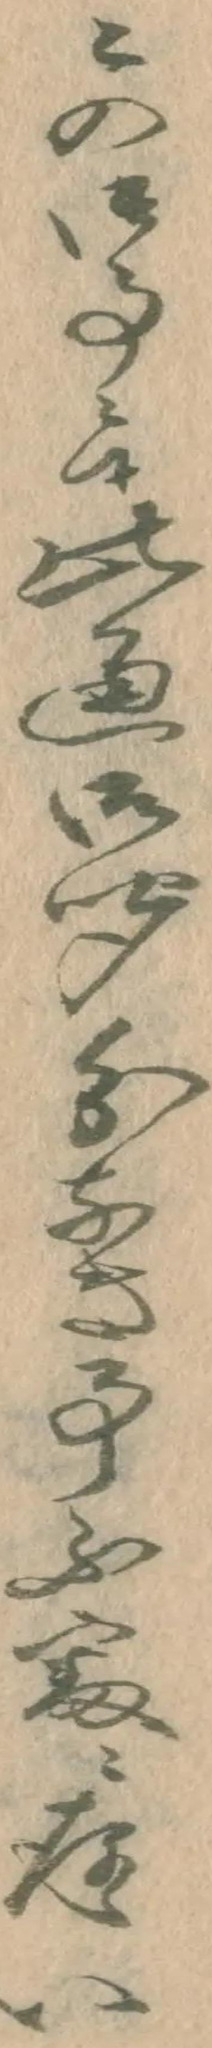との御事に候此通御聞分なき事ふ審に存い
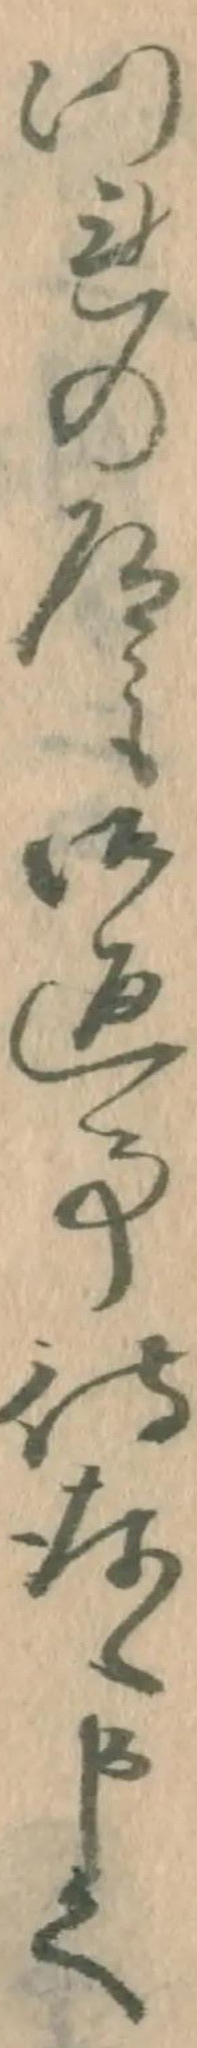川連の道にも御返事待存候申也

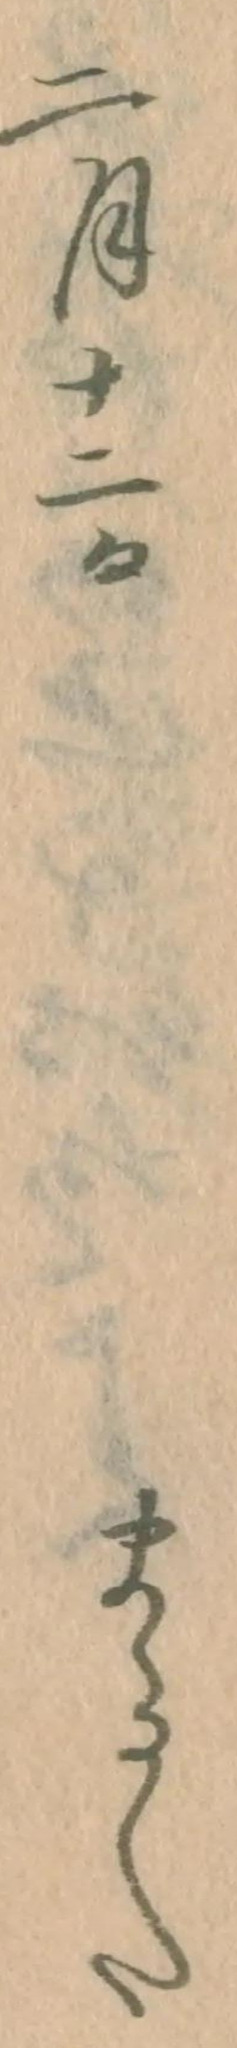二月十二日まるた
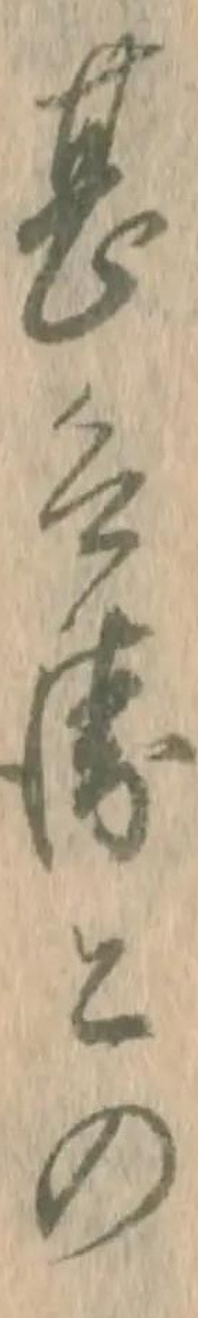甚兵衛との
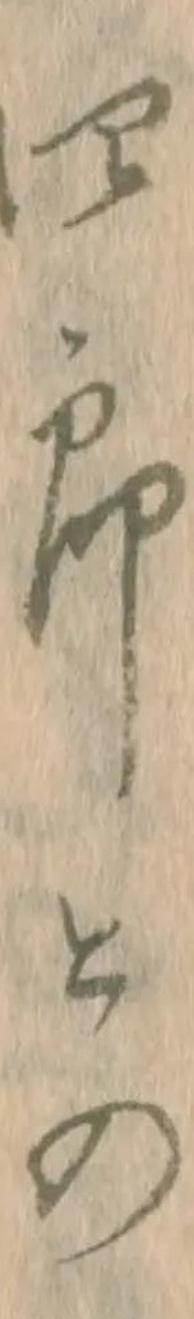四郎との
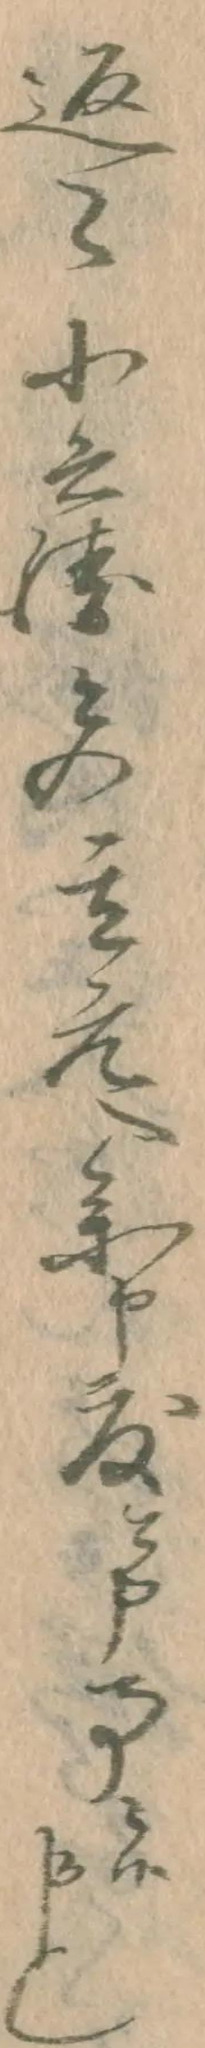返々小兵衛との其衆へ参申度と申事に候かしく
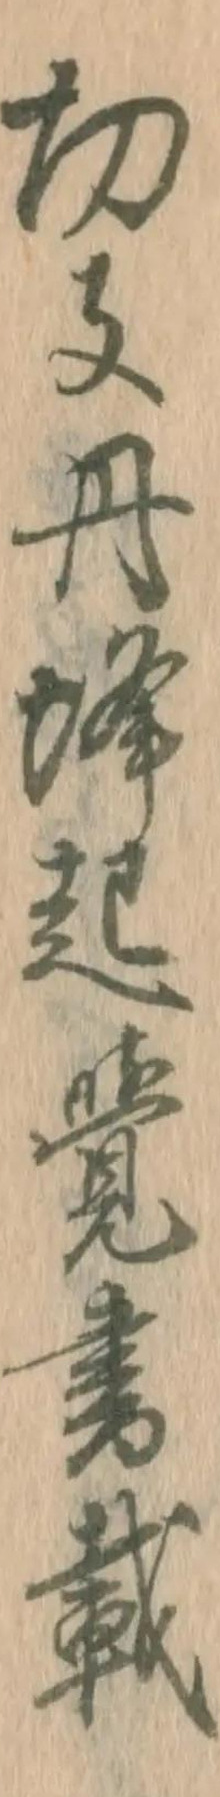切支丹蜂起覚書く載
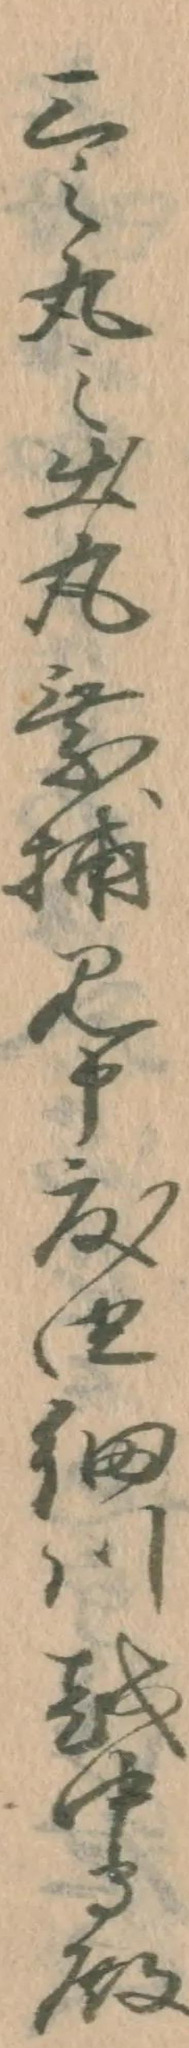一三之丸之出丸乗捕見申度由細川越中守殿
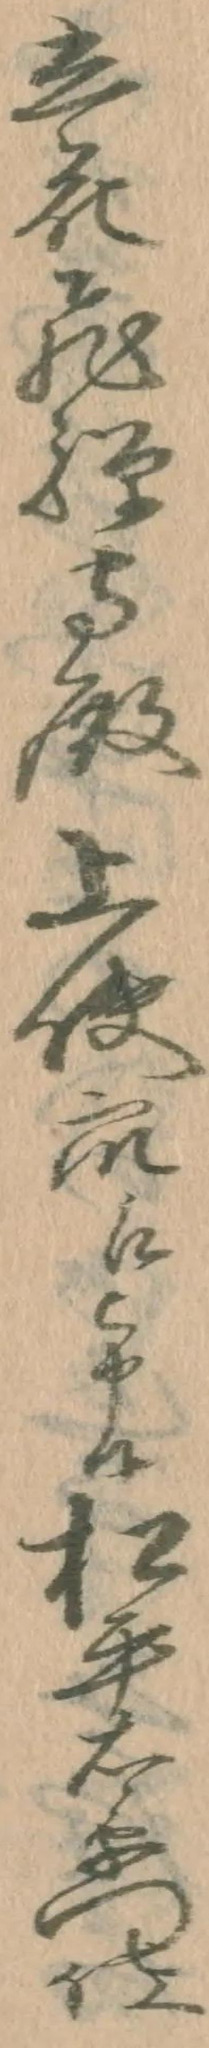立花飛騨守殿上使衆江被申候松平右衛門佐
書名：切支丹御退治記 49巻. [6]
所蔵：国立国会図書館 National Diet Library, JAPAN
